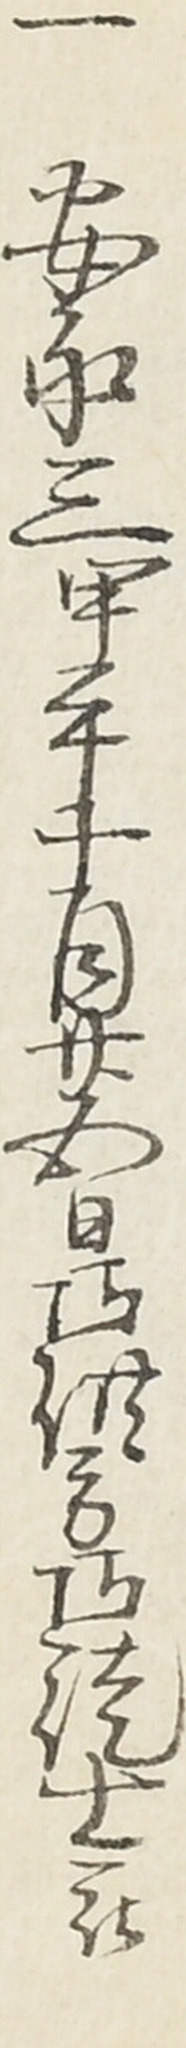一安永三甲午十月廿五日御供方御徒士被
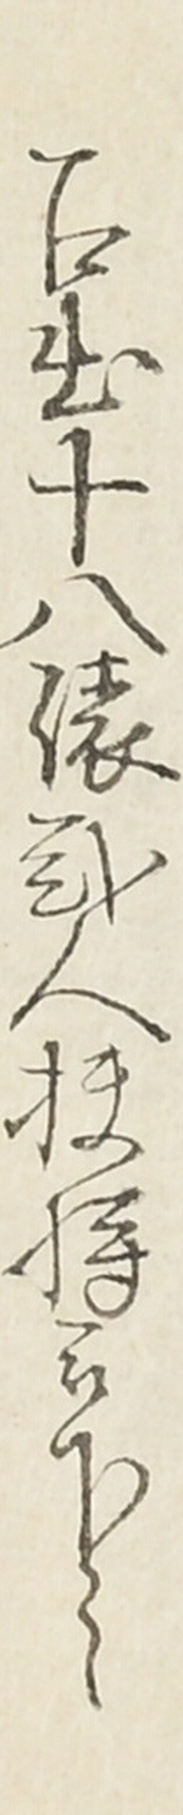召出十八俵弐人扶持被下之
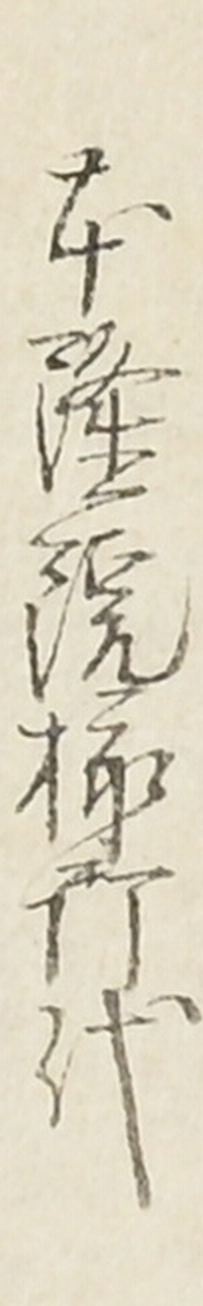本隆院様御代
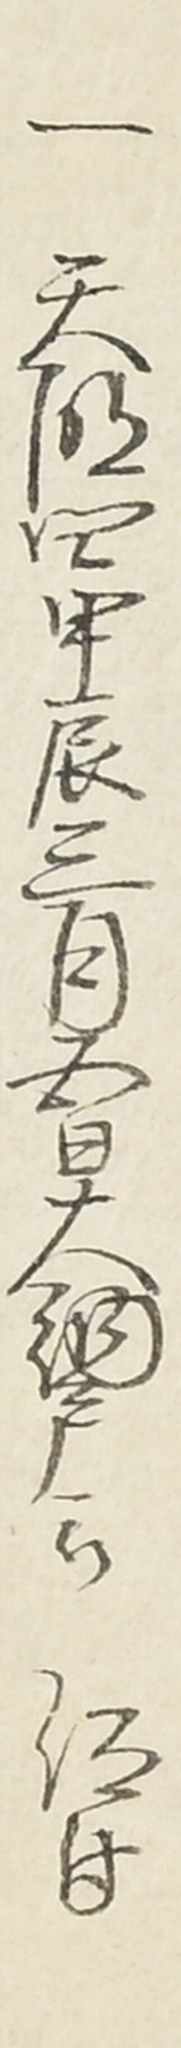一天明四甲辰三月五日大納戸被仰付
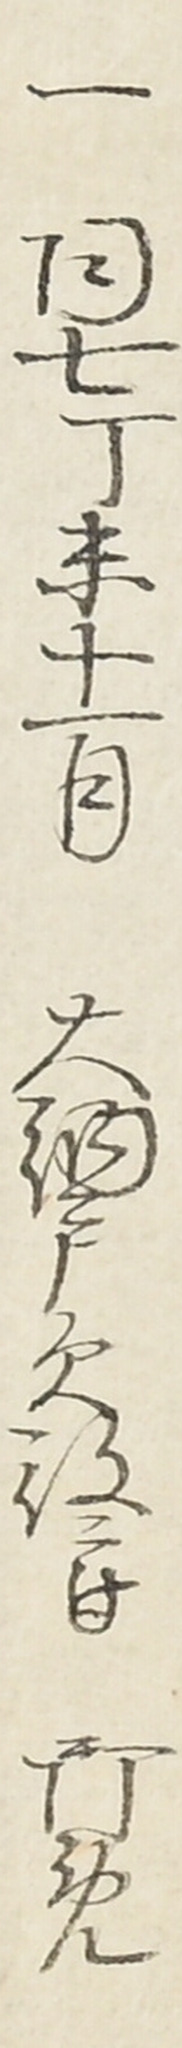一同七丁未十一月大納戸欠役ニ付御免
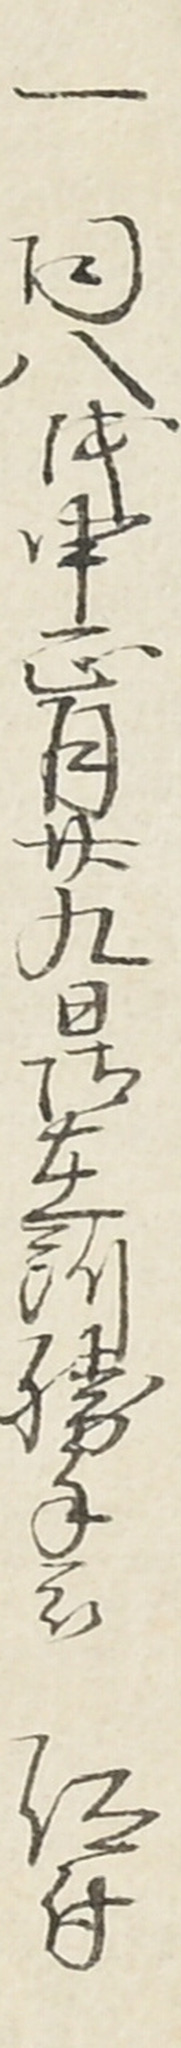一同八戊申正月廿九日御在所勝手被仰付
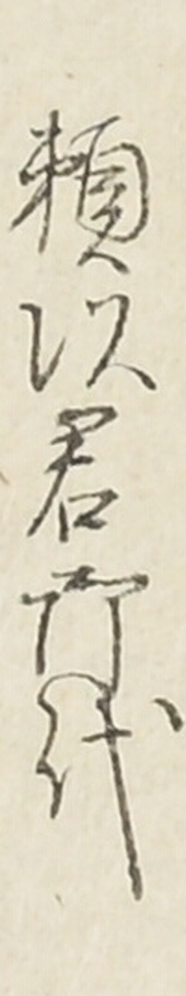頼以君御代
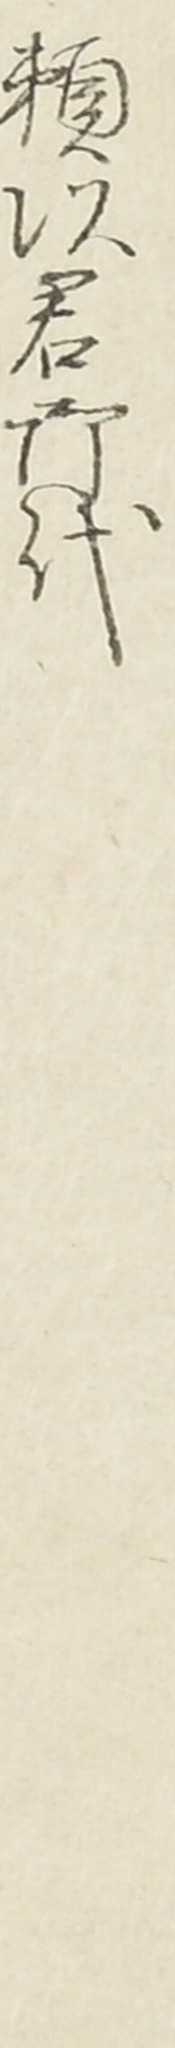頼以君御代
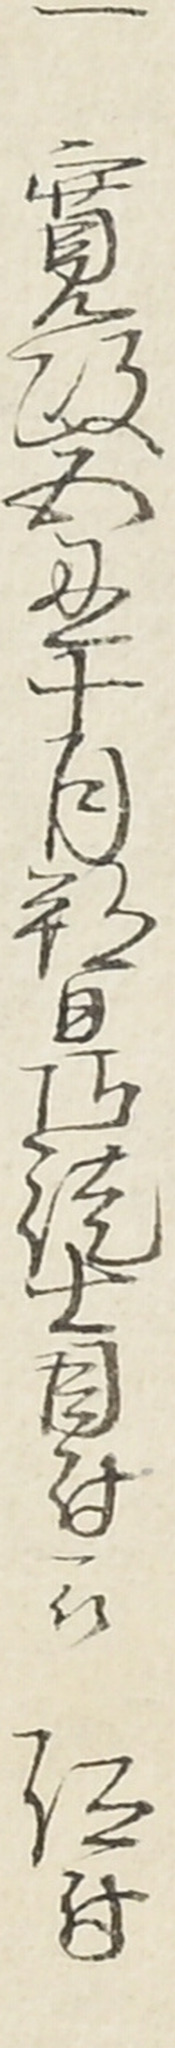一寛政五丑十月朔日御徒士目付被仰付
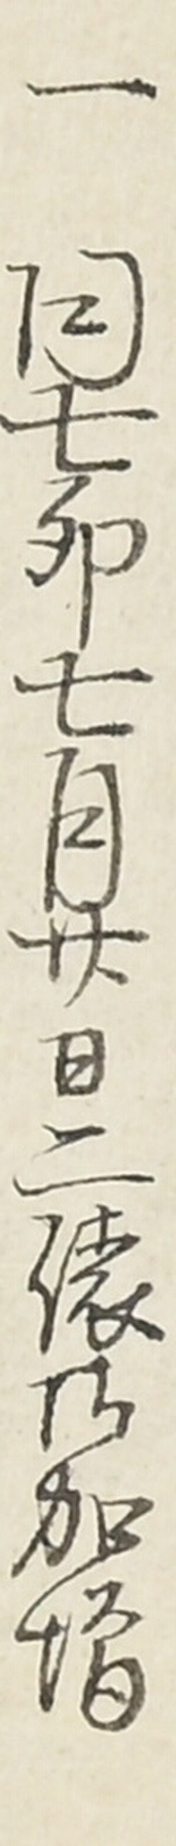一同七卯七月廿日二俵御加増
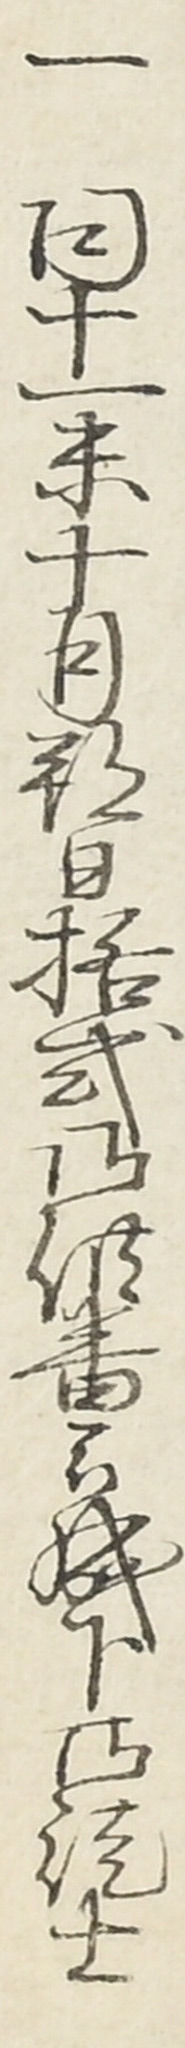一同十一未十月朔日格式御供番被成下御徒士
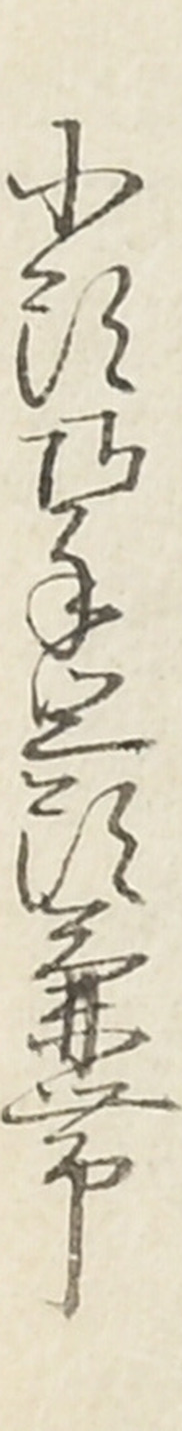小頭御手廻頭兼帯

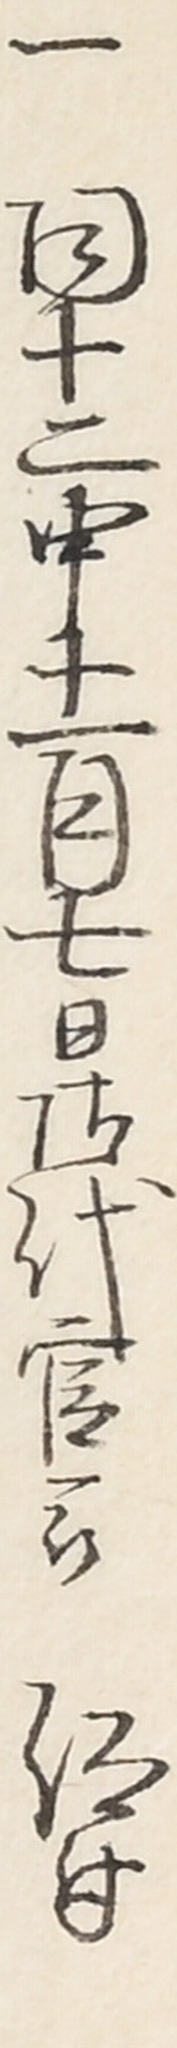一同十二申十一月七日御代官被仰付
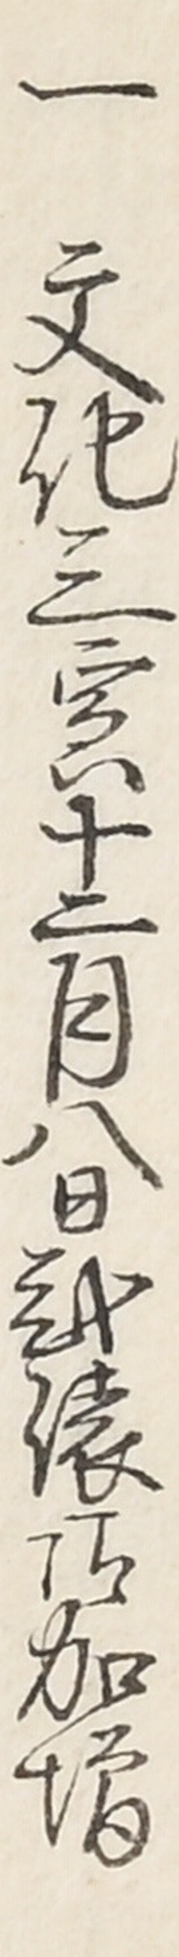一文化三寅十二月八日弐俵御加増
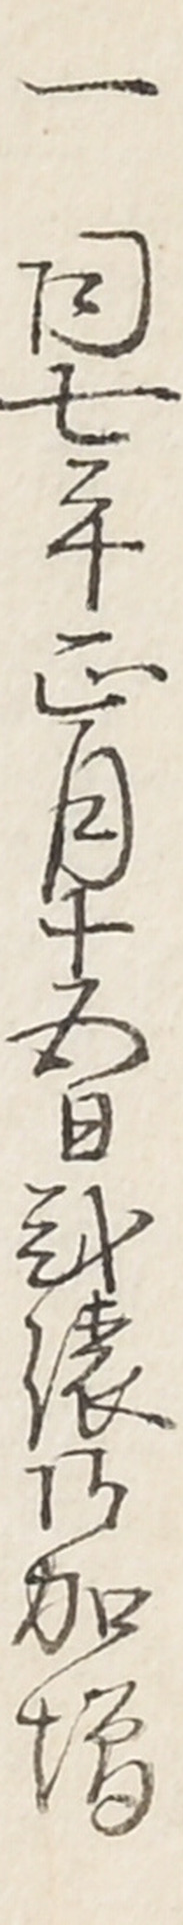一同七午正月十五日弐俵御加増
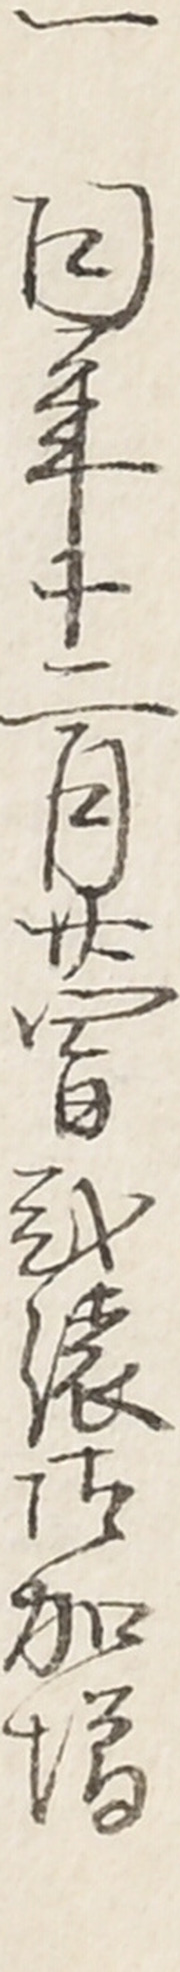一同年十二月廿四日弐俵御加増
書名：無足諸士勤仕録（四）
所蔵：伊那市立高遠町図書館・合同会社AMANE
